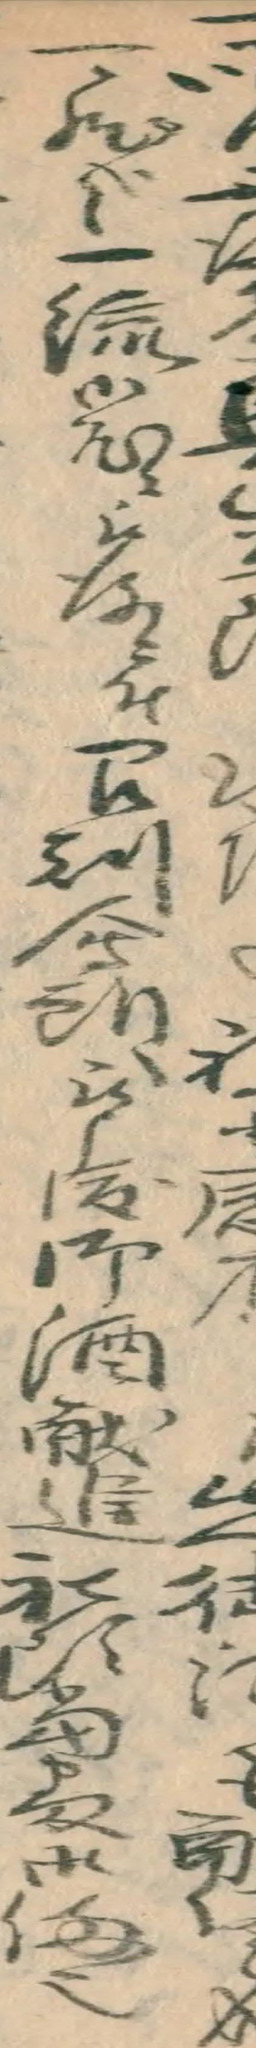可然哉一統御尤ニ被存ニ付即刻会所へ被申渡御酒献進社頭当番御備也
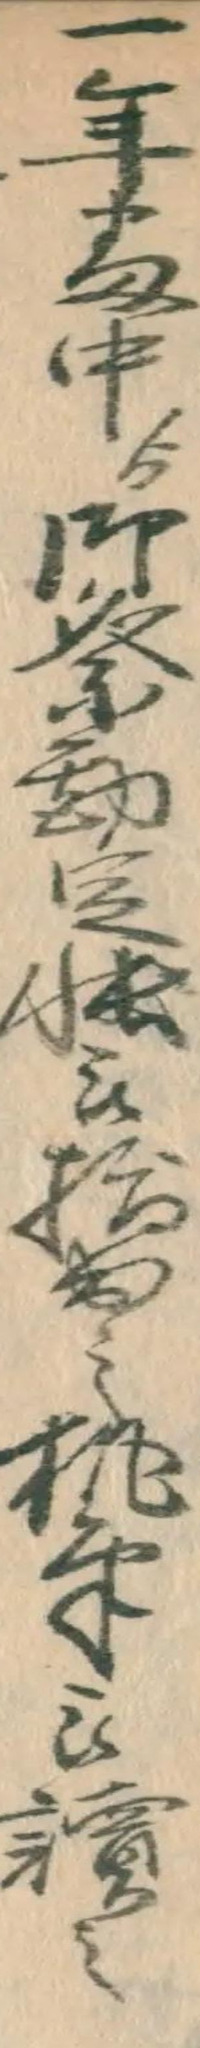一年番中ゟ御祭勘定帳被指出之執筆被読之
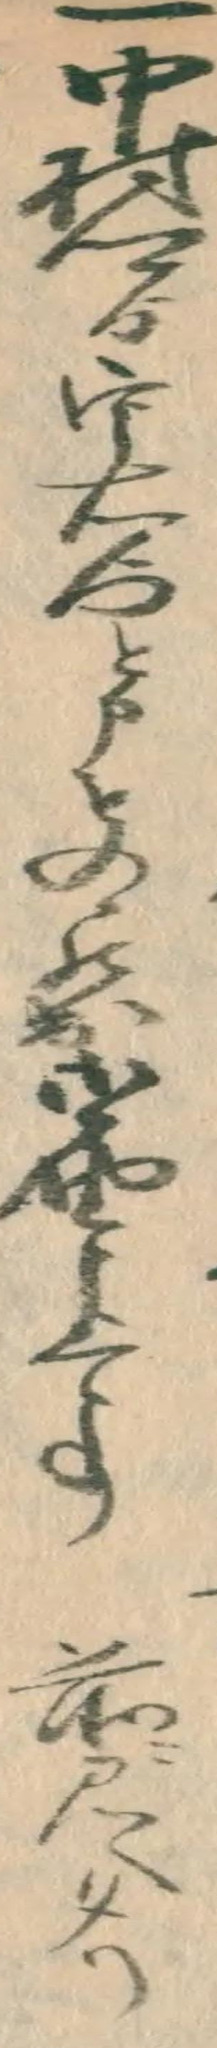一中村郷ゟ宇右衛門と申もの罷出御届申上候事前ニ見へタリ
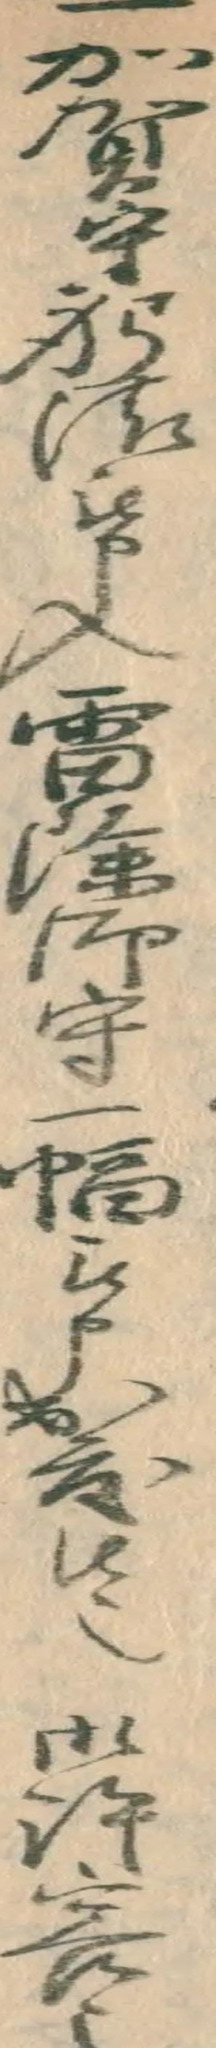一加賀守躬清被申入雷除御守一幅被申出度由也御許容也
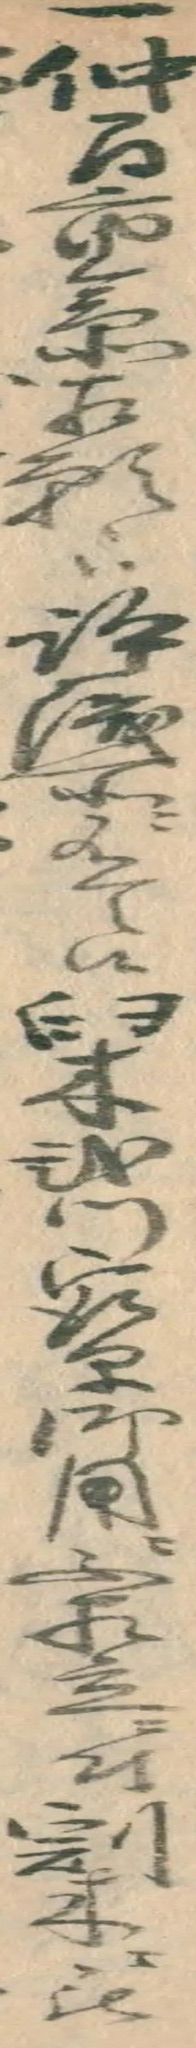一仲間市兵衛相願候ハ評議所ニ有之候臼木弐ツ最早御用ニ不相立ニ付割木ニ被
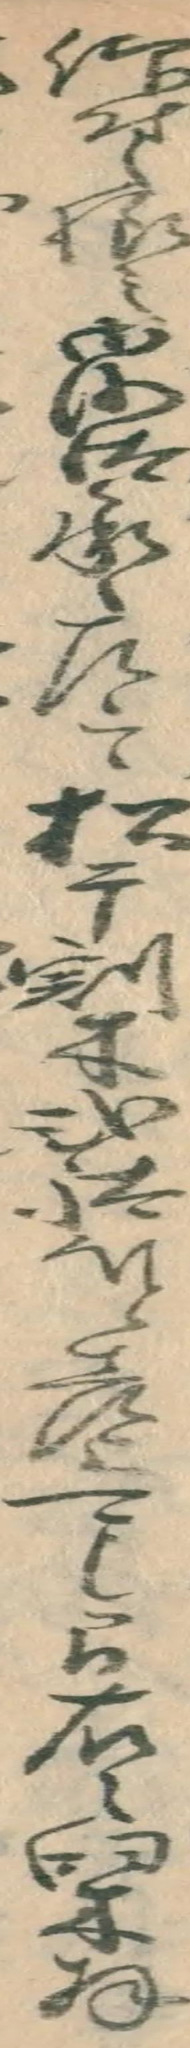仰付候様之御沙汰承候左候ハヽ松干割木弐駄ほと差上可申候間右之臼木拝
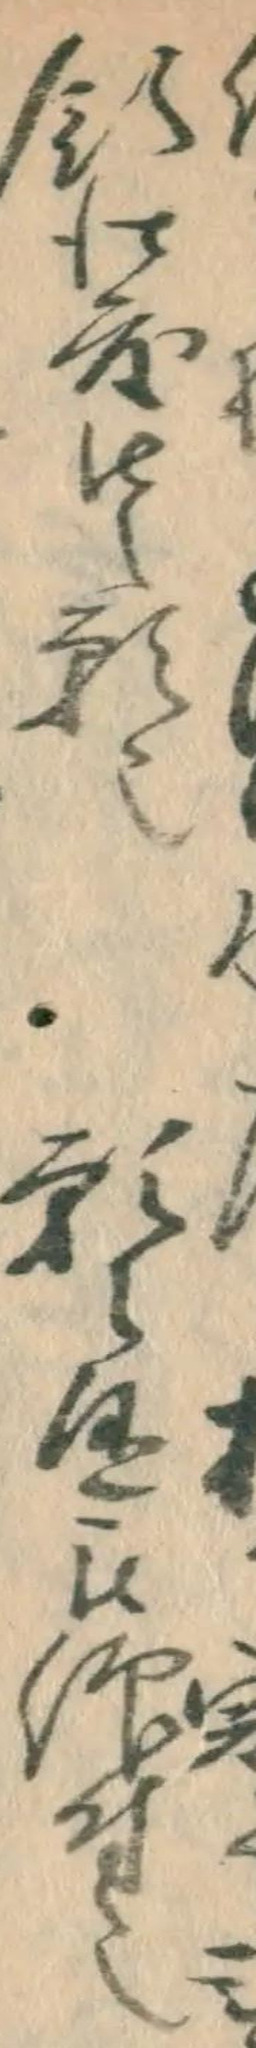領仕度由之願也願之通被仰付也
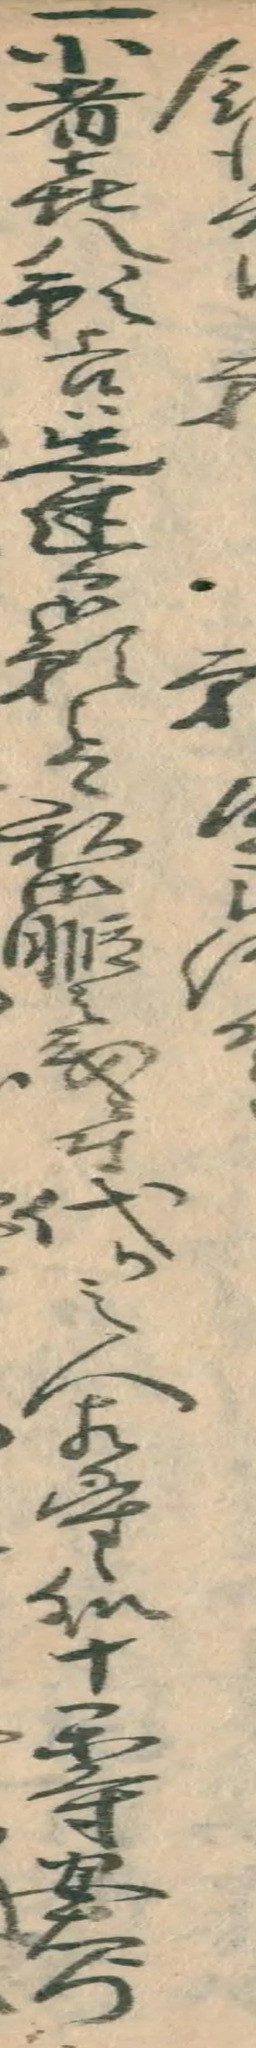一小者喜八願上候ハ先達而御願申上候私御暇之義ニ付代り之人相尋候処十楽寺安右衛門
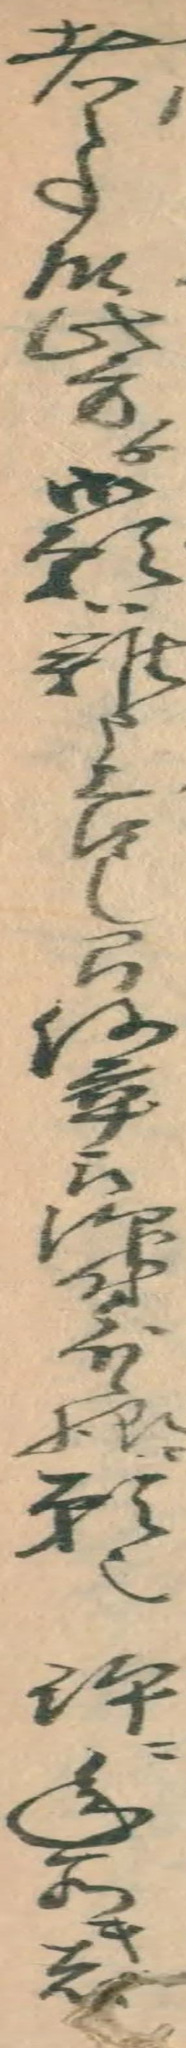者之事故此方ゟ御願ハ難申上由申候間何卒被仰付被下候様ニ願也評ニ年若キ者

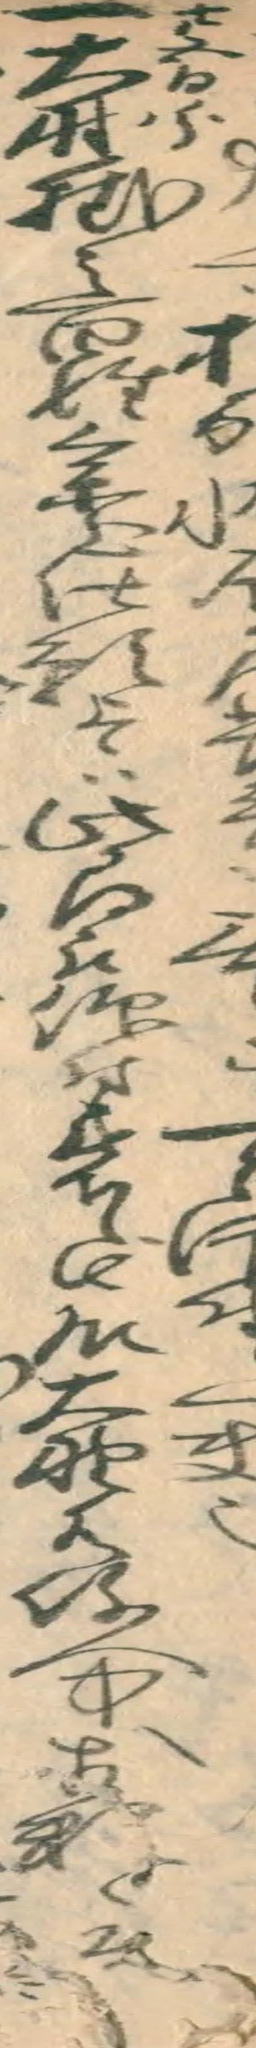一大野掛之百姓参上仕願上候ハ此間被仰付被下由故大野水役人中へ相頼候
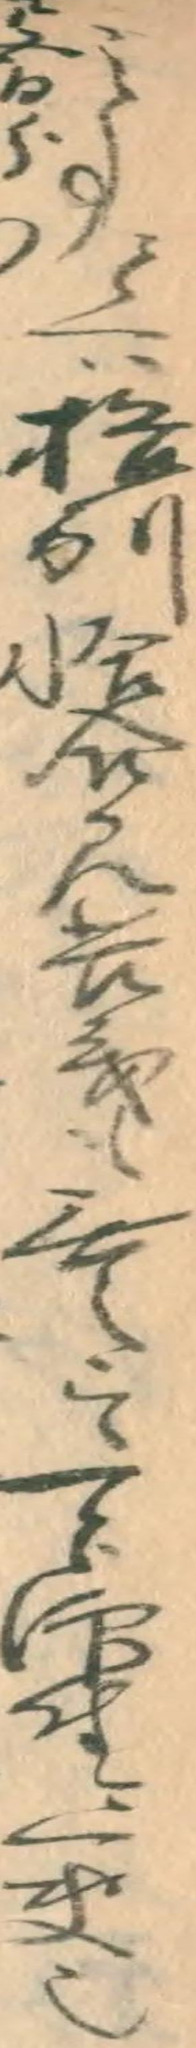之事ニ候ヘハ格別恰合見苦義も無之候ハヽ可被仰付ニ一決也
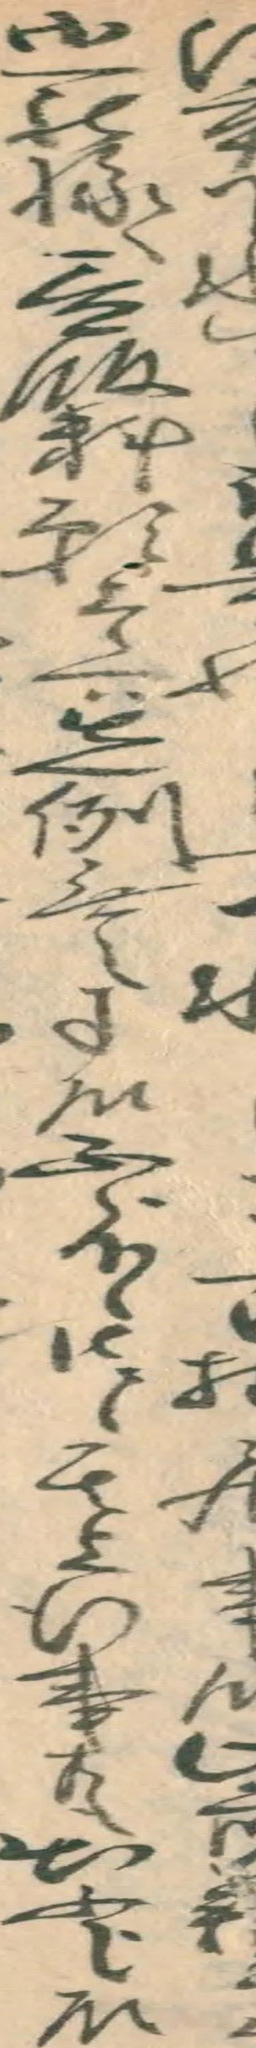御一社様へ昼飯料願上候へハ先例無之事故不被下候由ニ候其上行事共も出不申候故
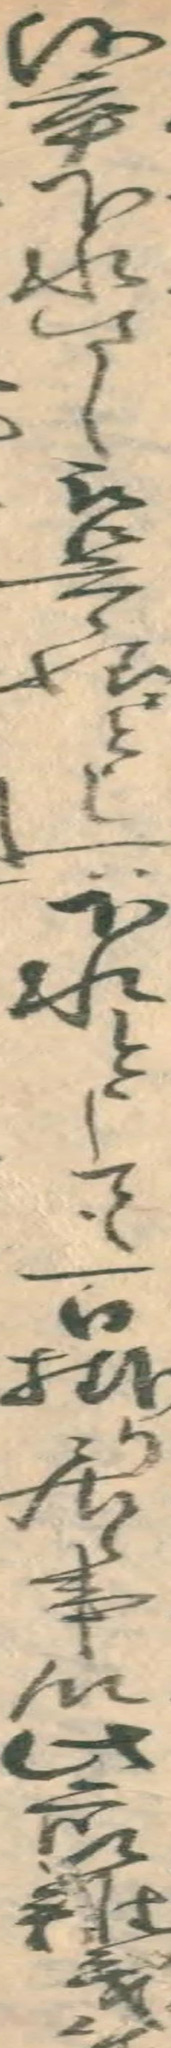何卒下水いたし被呉候様ニと申候へハ下水と申ても一日掛り居候事故此節難義ニ付
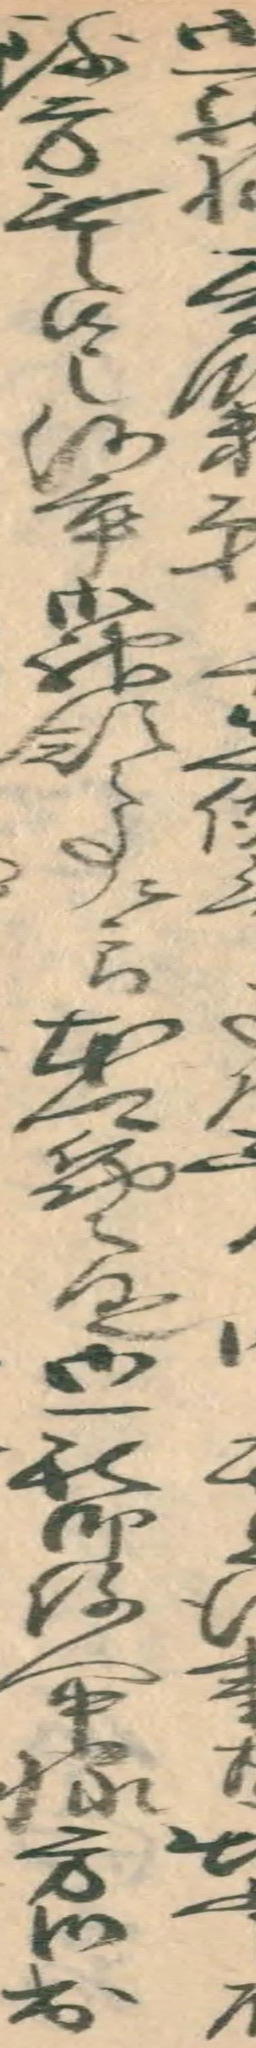致方無之由申候何卒御神領之事ニ候間本郷筋之通御一社御役人中様方御出
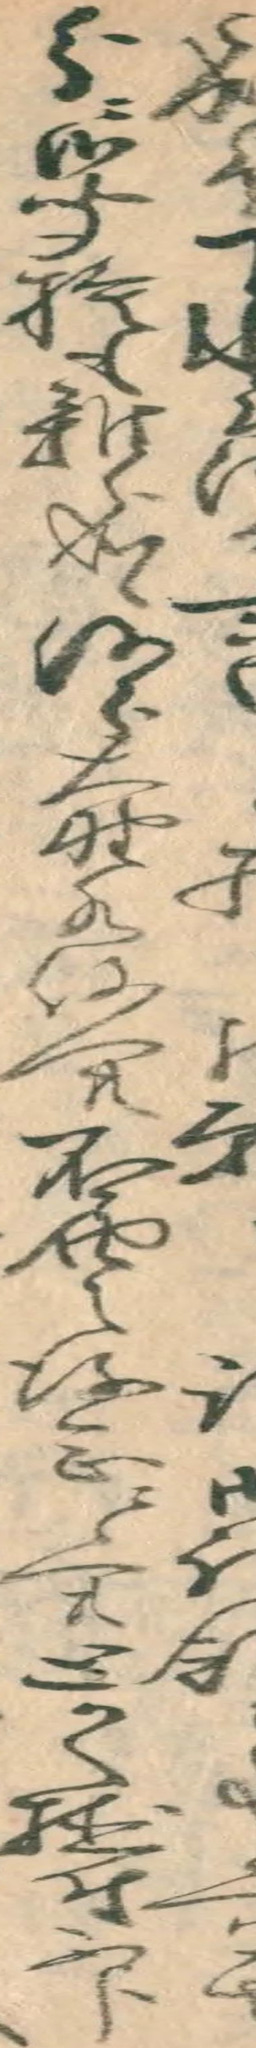分ニ御聞捨も難被成候何分大野水役人共不届之存念ニ候へ共とかく植付不申
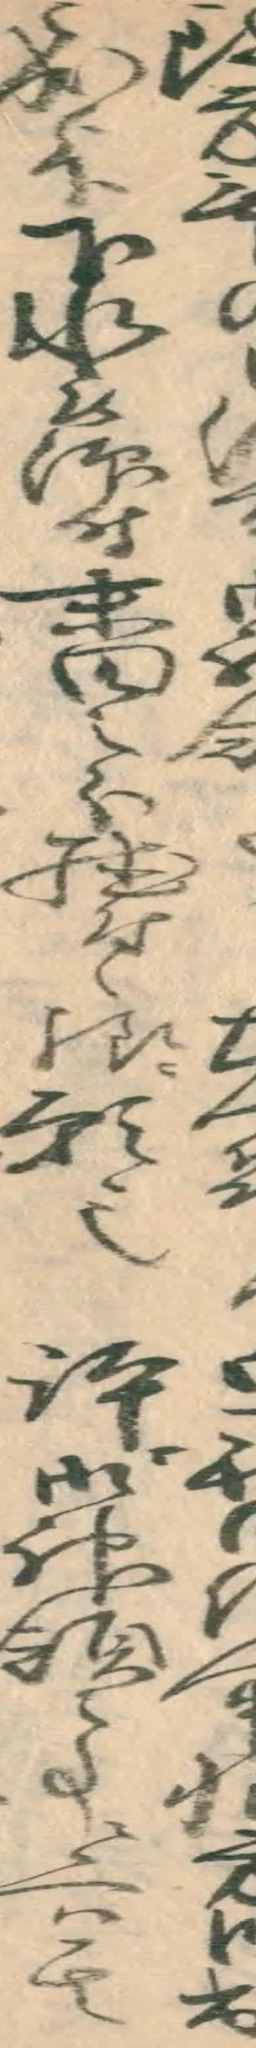被成被下下水被仰付末田之分植付候様ニ願候也評ニ御神領之事ニ候ヘハ其
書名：賀茂社記録. 第58冊
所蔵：国立国会図書館 National Diet Library, JAPAN
